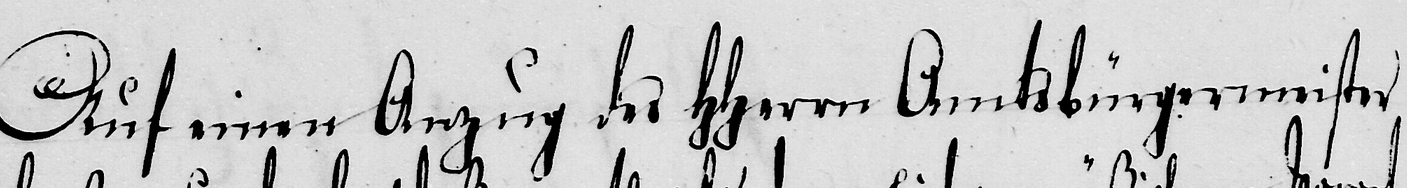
Auf einen Anzug des HHerrn Amtsbürgermeister
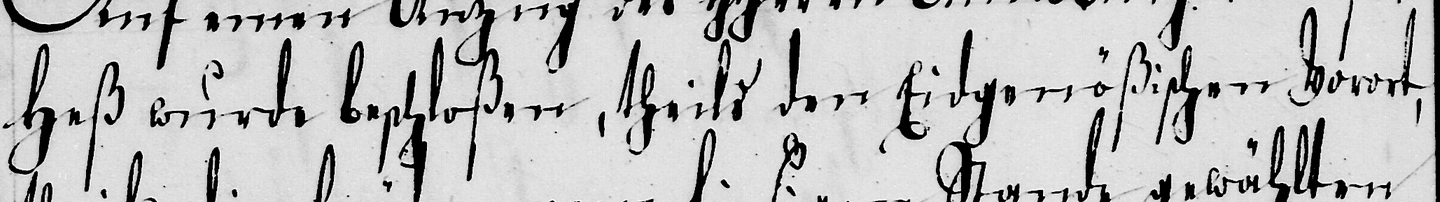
Heß wurde beschloßen, theils den Eidgenößischen Voror¬
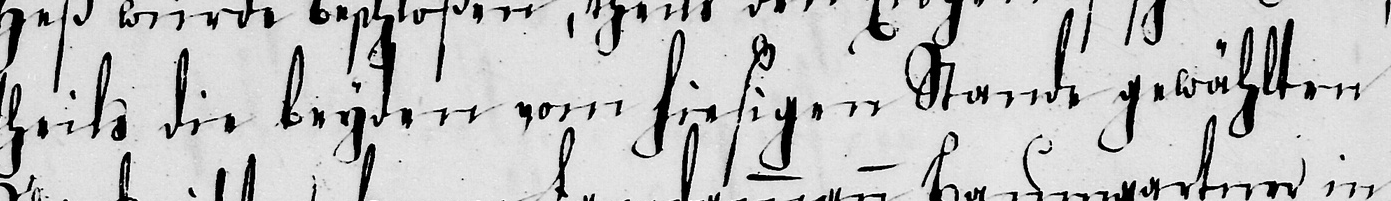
heils die beyden von hiesigen Stande gewählten
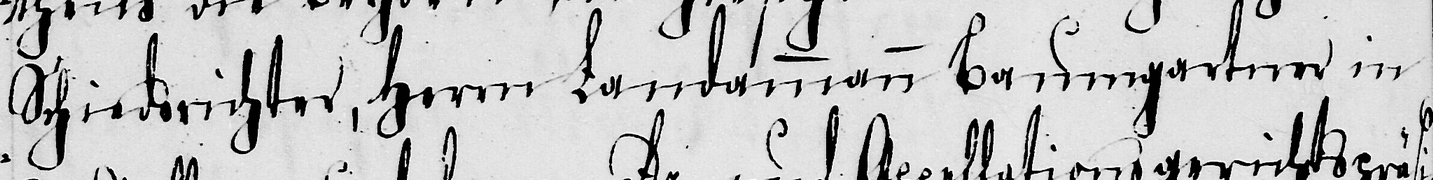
Schiedsrichter, Herrn Landammann Baumgartner in
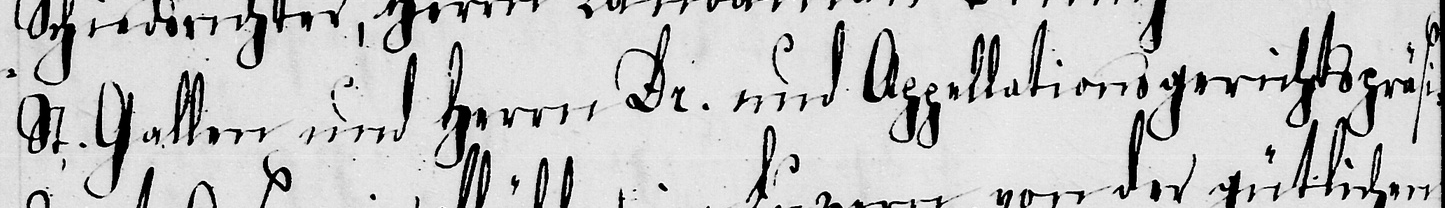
St. Gallen und Herrn Dr. und Appellationsgerichtspräs¬
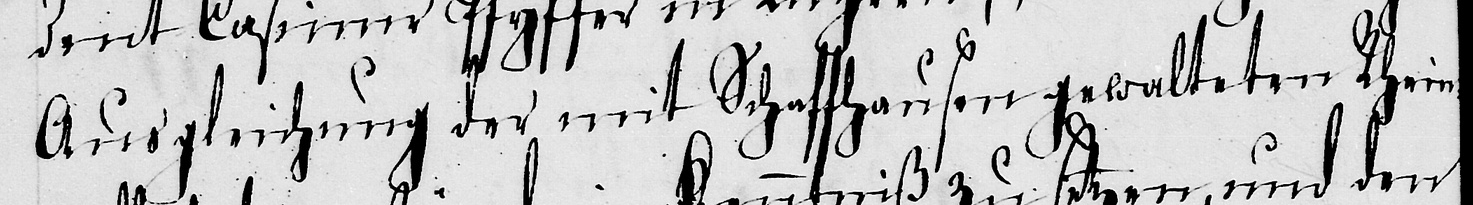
Ausgleichung der mit Schaffhausen gewalteten Rhein¬
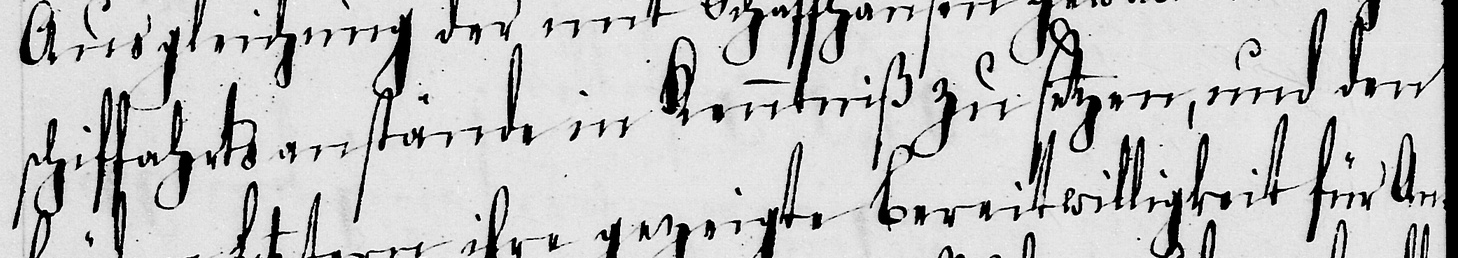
schiffahrtsanstände in Kenntniß zu setzen, und den
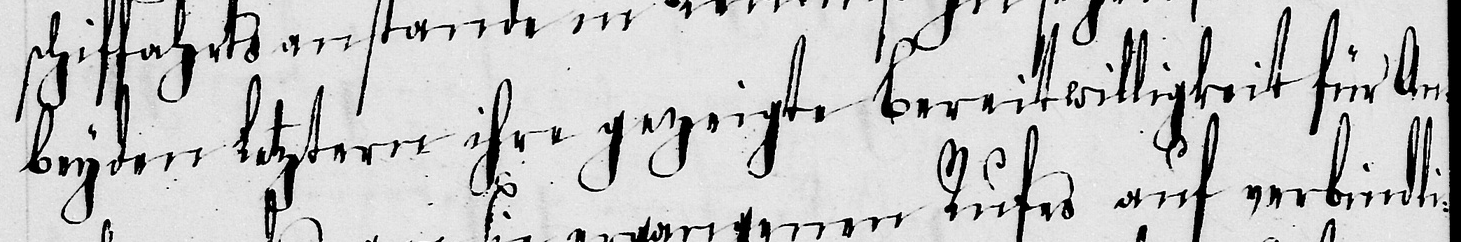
beyden letztern ihre gezeigte Bereitwilligkeit für An¬
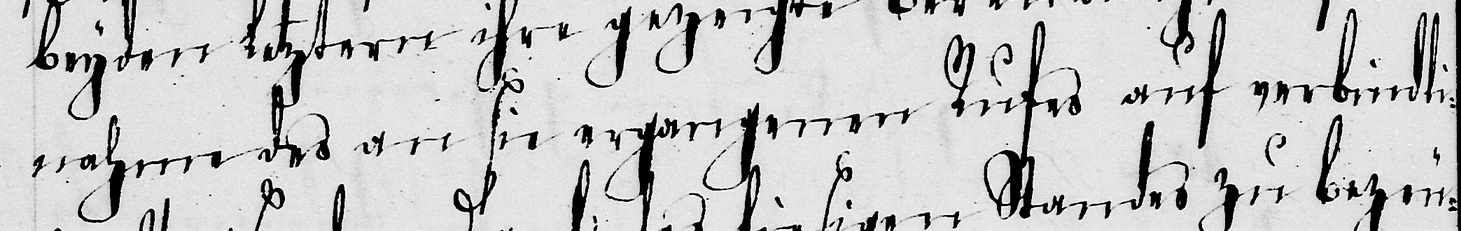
nahme des an sie ergangenen Rufes auf verbindl¬
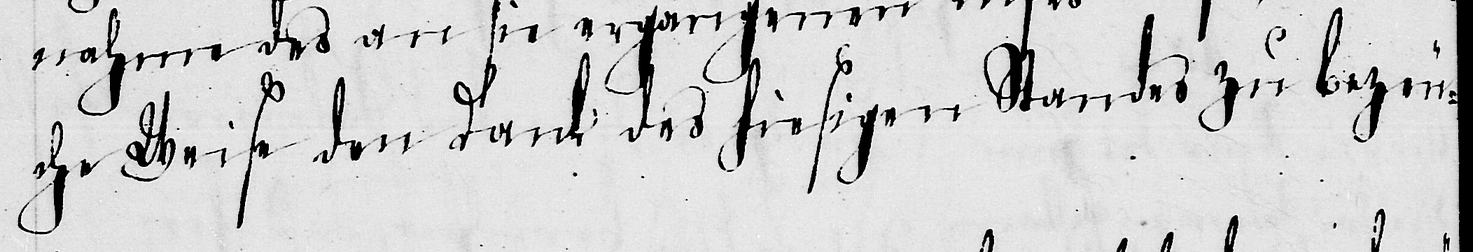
iche Weise den Dank des hiesigen Standes zu bezeu¬
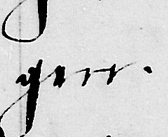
gen.
